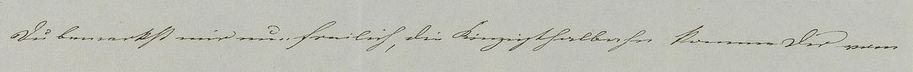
Du bemerkst mir nun freilich, die Kinzigthalbahn komme dir vom
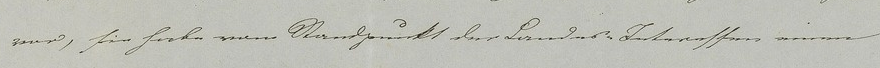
vor, sie habe vom Standpunkt der Landes-Interessen einen
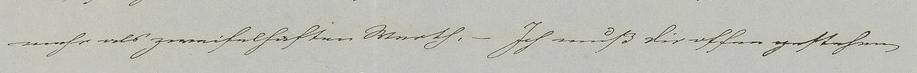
mehr als zweifelhaften Werth. – Ich muß dir offen gestehen
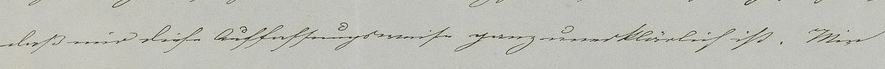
daß mir diese Auffassungsweise ganz unerklärlich ist. Mir
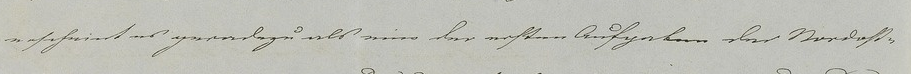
erscheint es geradezu als eine der ersten Aufgaben der Nordost-
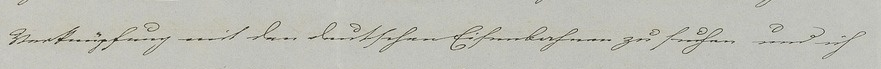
Verknüpfung mit den deutschen Eisenbahnen zu suchen und ich
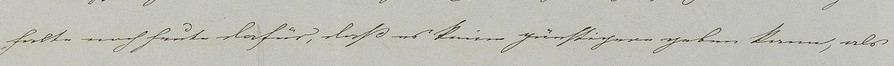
halte noch heute dafür, daß es keine günstigere geben kann, als
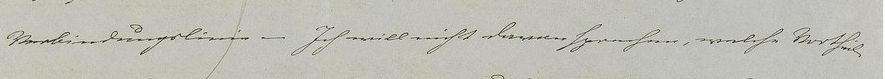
Verbindungslinie. – Ich will nicht davon sprechen, welche Vortheile
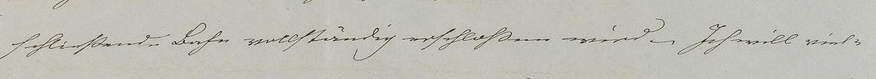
schließende Bahn vollständig erschloßen wird. – Ich will viel-
